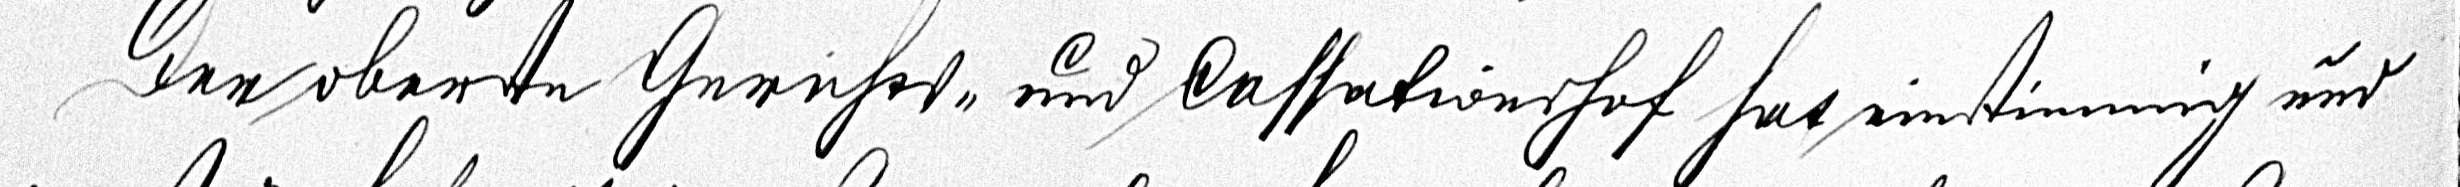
Den oberste Gerichts- und Cassationshof hat einstimmig und
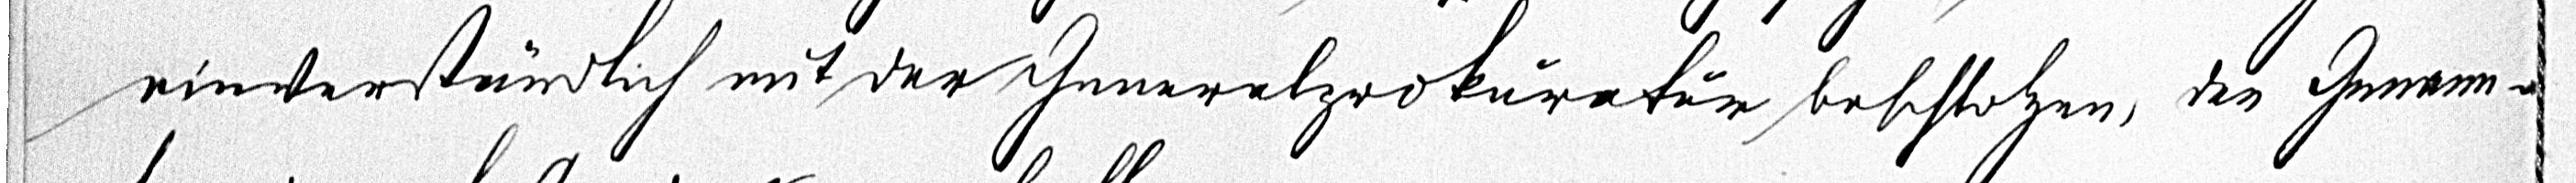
einverständlich mit der Generalprokuratur beschloßen, den Genann¬
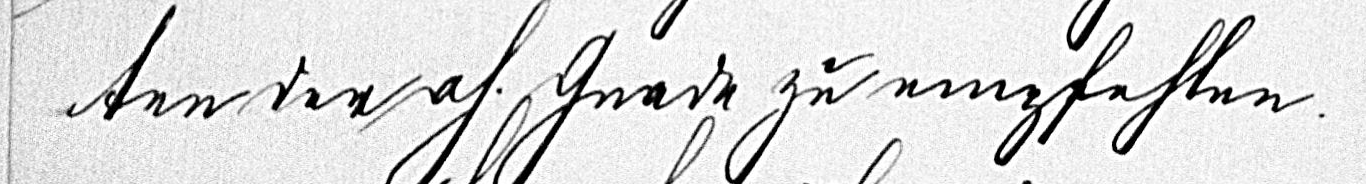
ten der ah. Gnade zu empfehlen.
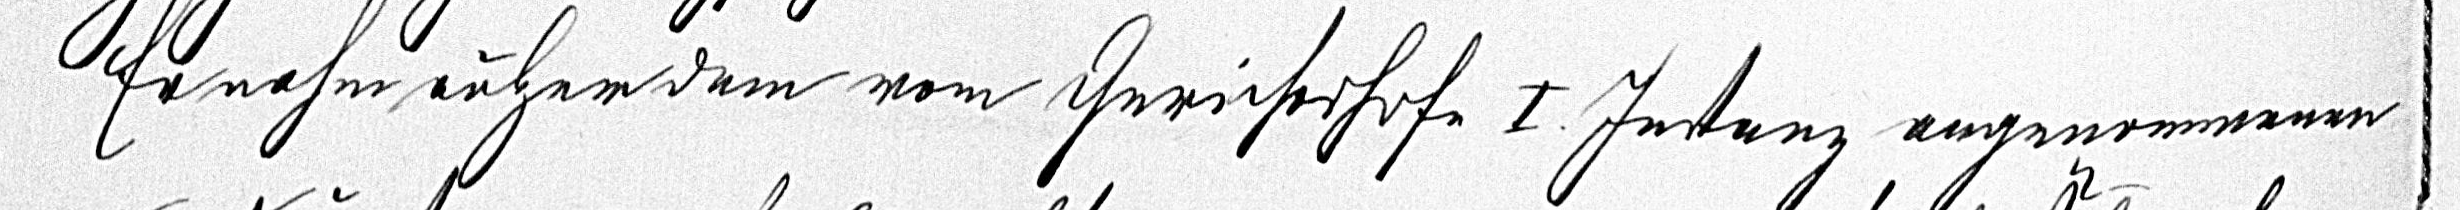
Er nahm, außer dem vom Gerichtshofe I. Instanz angenommenen
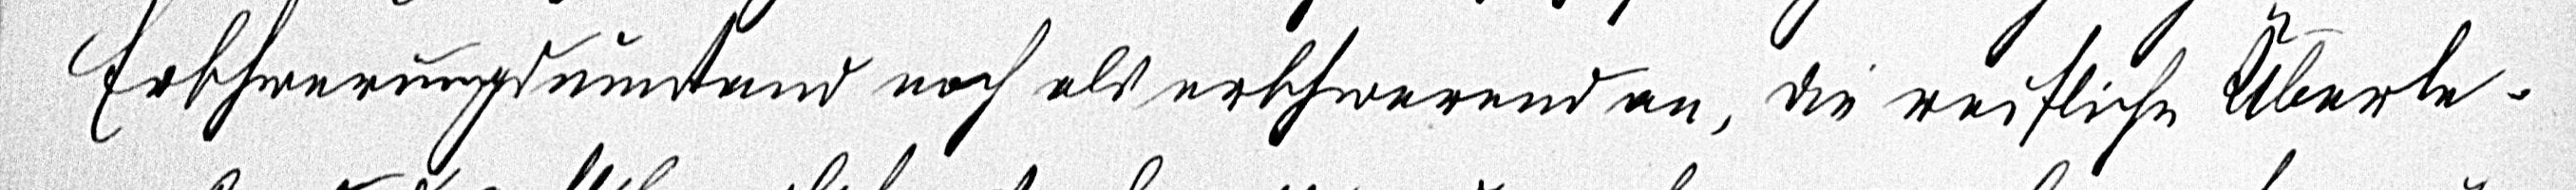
Erschwerungsumstand noch als erschwerend an, die reifliche Überle¬
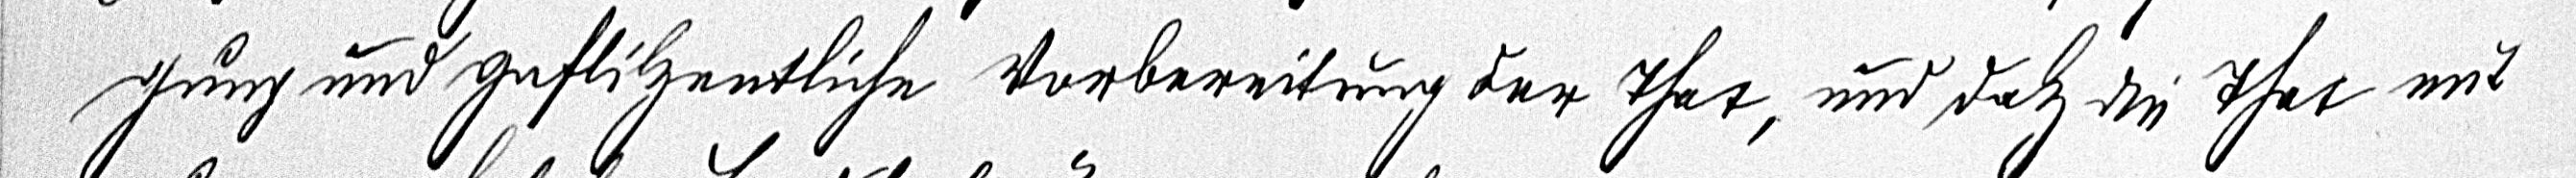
gung und gaflißentliche Vorbereitung der That, und daß die That mit
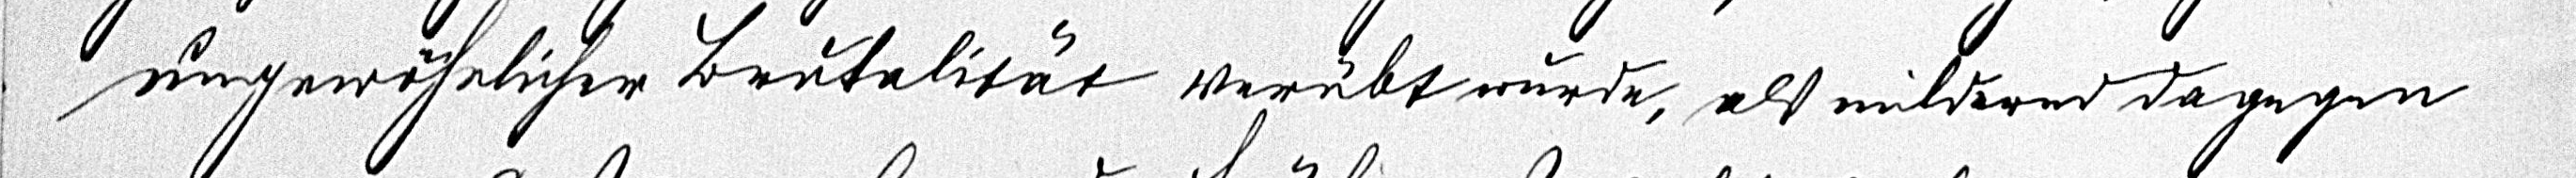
ungewöhnlicher Brutalität verübt wurde, als mildernd dagegen
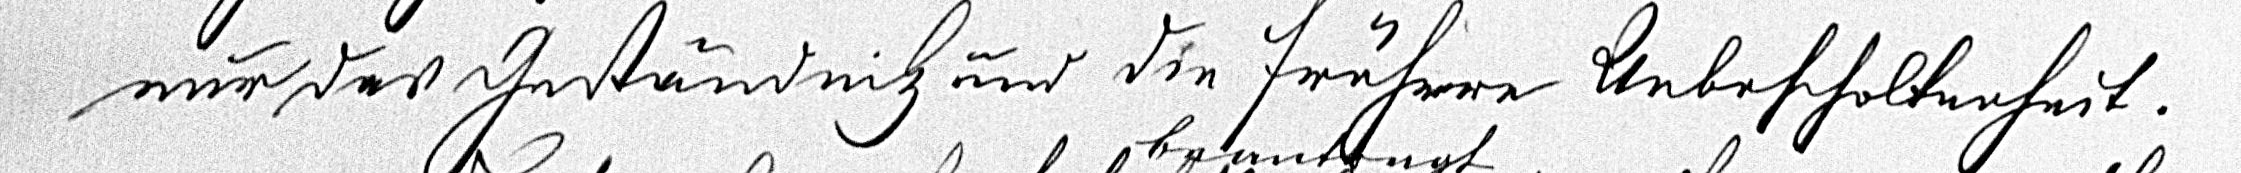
nur des Geständniß und die frühere Anbescholtenheit.
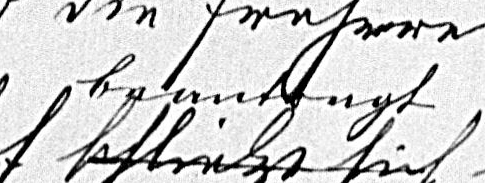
beantragt
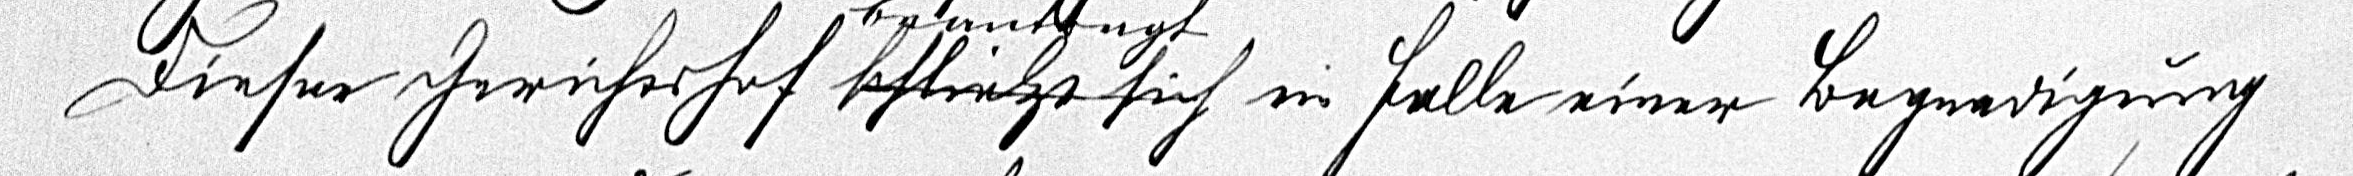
Dieser Gerichtshof in Falle einer Begnadigung
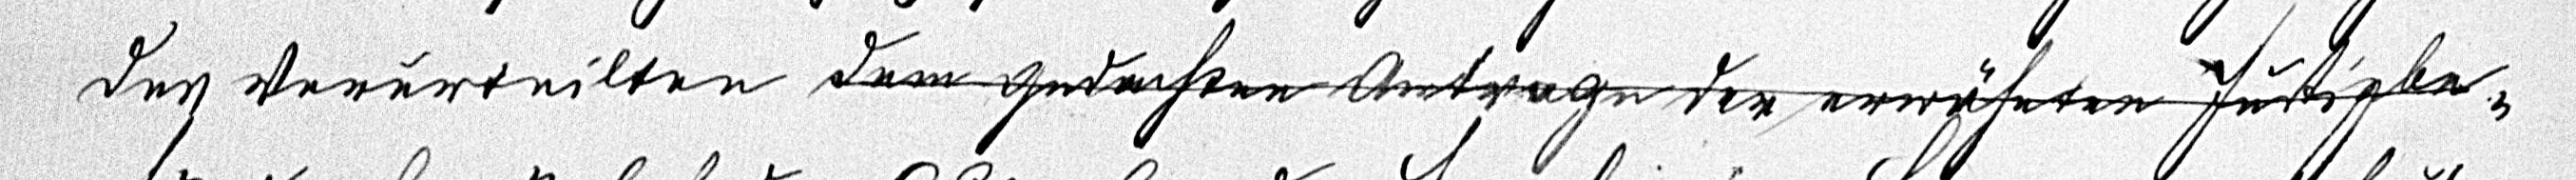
des Verurteilten
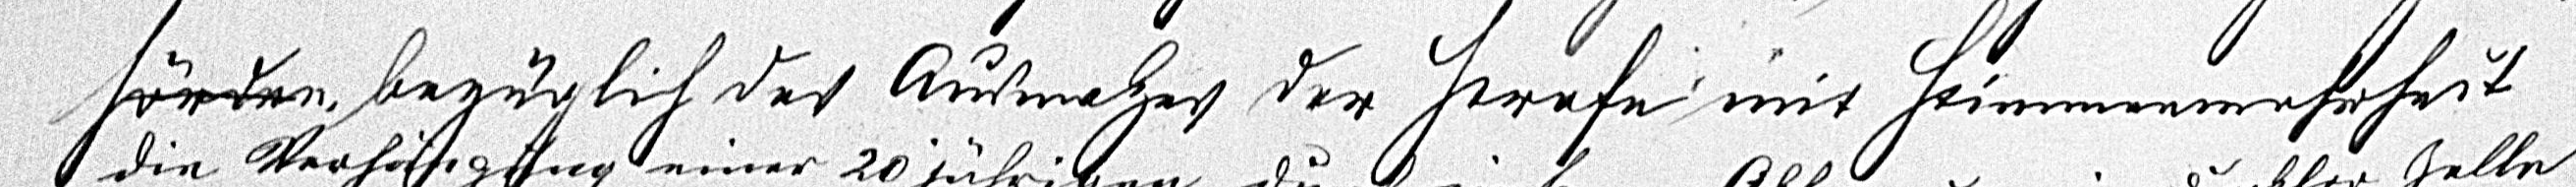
bezüglich des Ausmaßes der Strafe mit Stimmenmehrheit
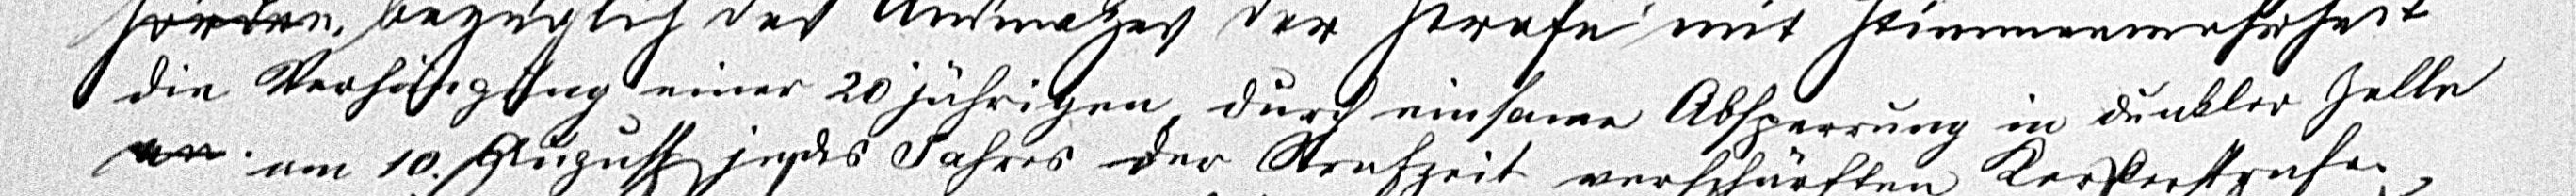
die Verhängung einer 20 jährigen durch einsame Absperrung in dunkler Zelle
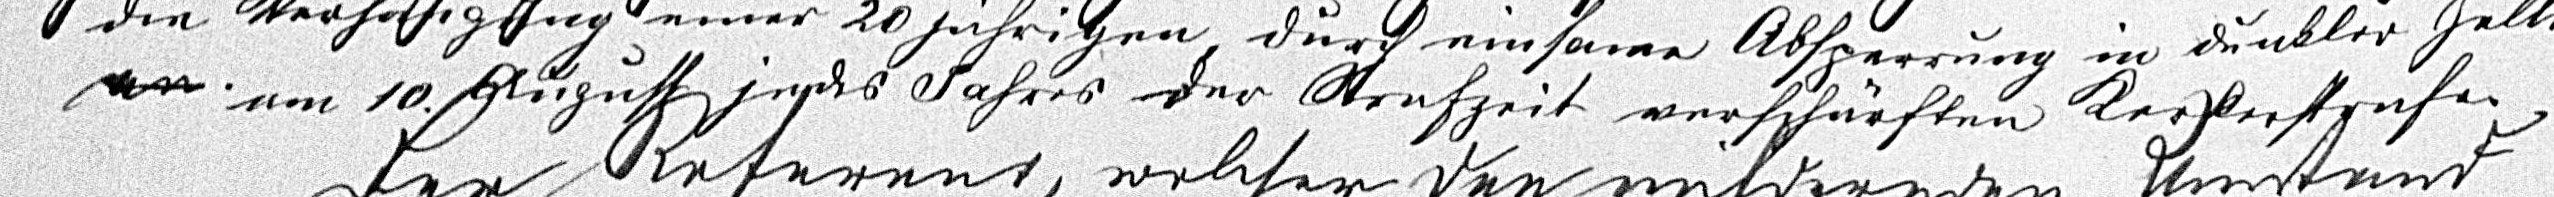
am 10. August jedes Jahres der ??zeit verschärften Kerkerstrafe.
